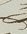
ziehen,
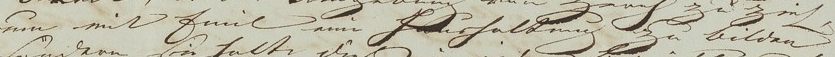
um mit Emil eine Haushaltung zu bilden,
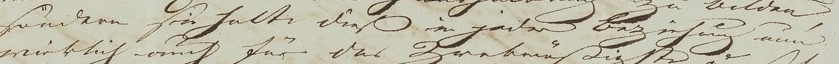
sondern sie halte dieß in jeder Beziehung nun
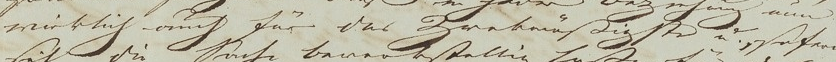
wirklich auch für das Zwekmäßigste u., sofern
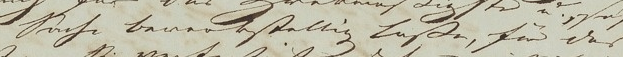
Sache bewerkstelligen laße, für das
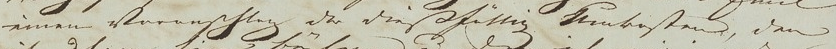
einen Voranschlag der dießfälligen Umkosten, den
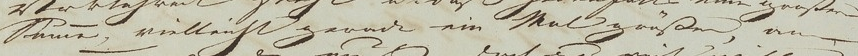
Summe, vielleicht gerade ein Mal größer, an-
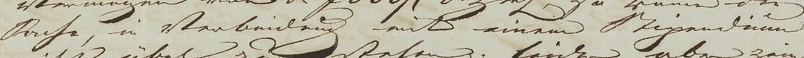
Sache, in Verbindung mit einem Stipendium
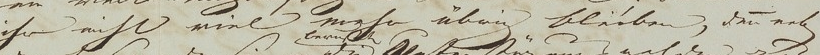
ihr nicht viel mehr übrig bleiben, denn neben
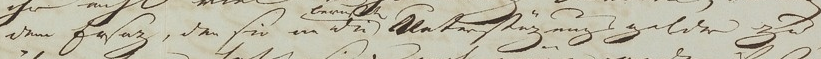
dem Ersaz, den sie an die bewußten Unterstüzungsgelder zu
